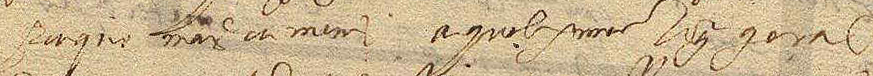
pouquo mais ou menos ao qual snnor Vigro geral
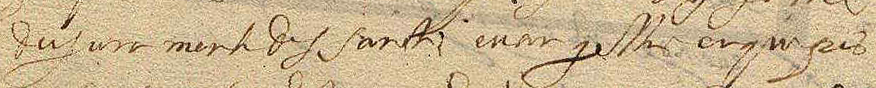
deu juramento dos santos euangelhos en que pos
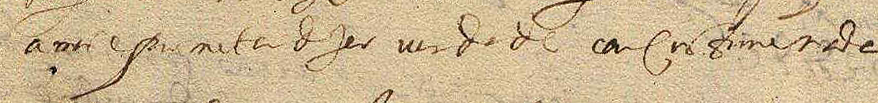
a maõ e prometeu dizer uerdade e ao Costume nada
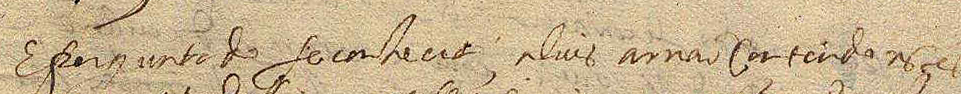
E perguntado se conhecia a luis arnao Conteudo nestas
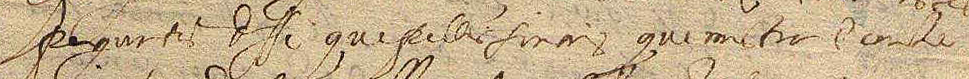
perguntas disse que pellos sinais que mostra o conhe
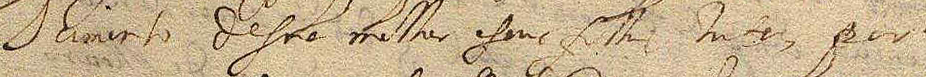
cimento de sua molher e seus filhos ho tem por
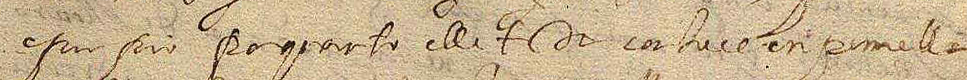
o propio porquanto elle testa conhece en pennella
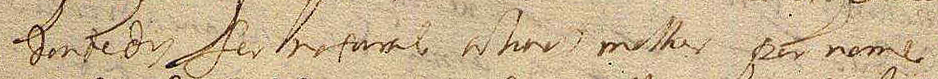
donde diz ser natural a huā molher por nome
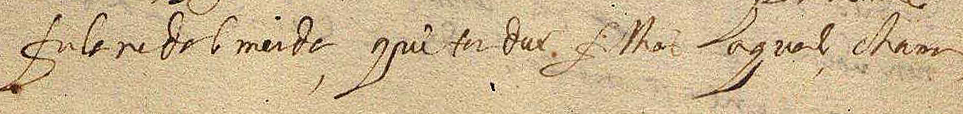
fulana dalmeida, que tem duas filhas a qual chamam
